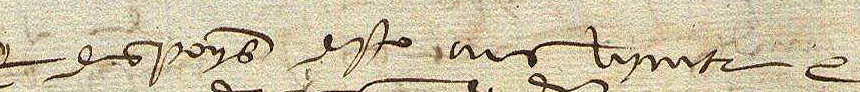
E despoys desto aos vymte e
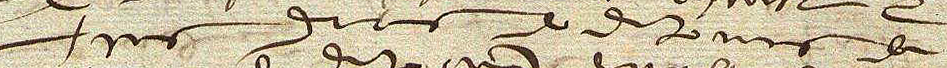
tres dias do dito mes de
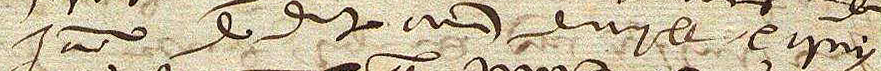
Janro do dito anō de mjll e quy
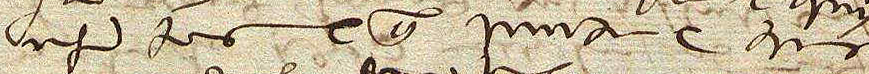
nhētos e q̄orenta e tres
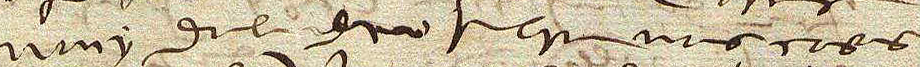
na cydade de coJnbra nas casas
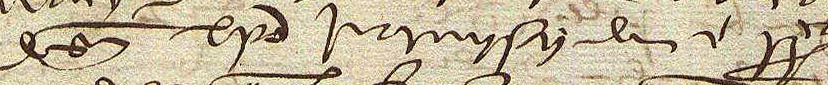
do s̄or bpō Jnquysydor ē ꝓpca
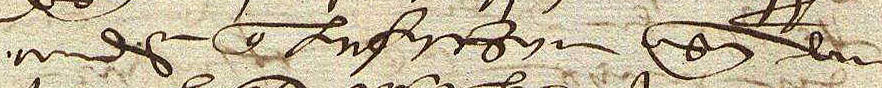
audja q̄ hy fyczya o s̄or dou
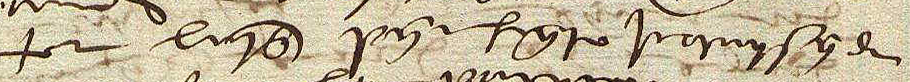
tor lujs pynheyro Jnquysydor
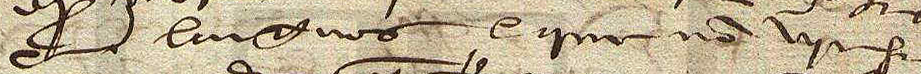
e ēbarguos e que nō vynha
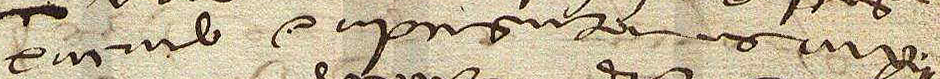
laçado e apresentou os arty
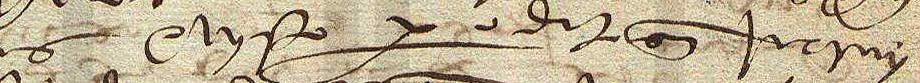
tes e vysto ꝑ o dito s̄or Jnquy
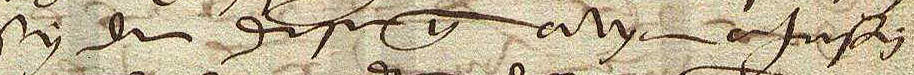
sydor dise q̄ avya a Justy
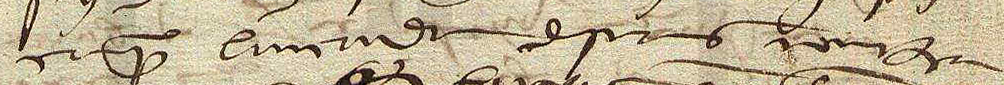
ça p̄o lançada de suas comtra
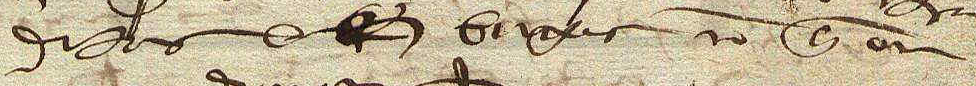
ditas e Embarguos c̄o q̄ ou
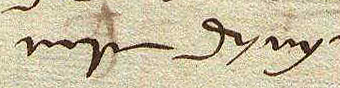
uera dy uyr
